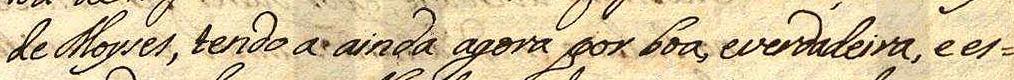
de Moyses, tendo a ainda agora por boa, e verdadeira, e es
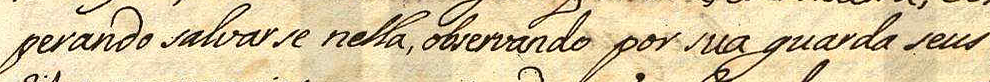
perando salvar se nella, observando por sua guarda seus
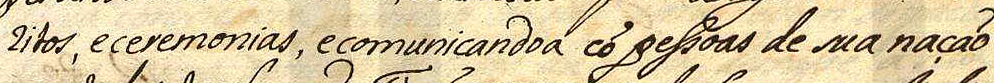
ritos e ceremonias e comunicandoa cō pessoas de sua naçaõ
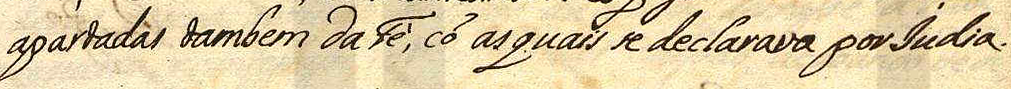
apartadas tambem da Fè, cō as quais se declarava por Iudia.
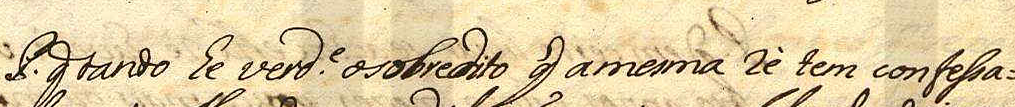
P. q̄ tanto he verd.e o sobredito q̄ a mesma ré tem confessa
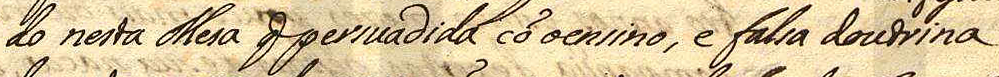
do nesta Mesa q̄ persuadida co̅ o ensino, e falsa doutrina
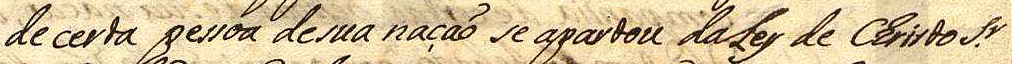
de certa pessoa de sua naçaõ se apartou da Ley de Christo s.r
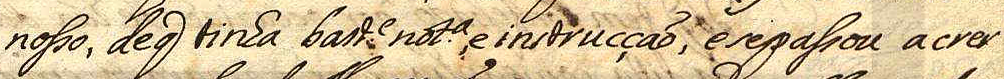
nosso, de q̄ tinha bast.e not.a, e instrucçaõ, e se passou a crer
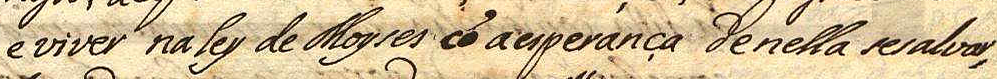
e viver na ley de Moyses cō a esperança de nella se salvar,
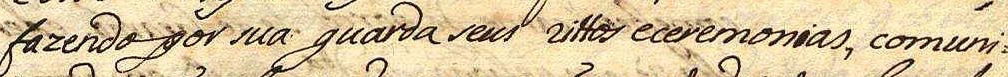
fazendo por sua guarda seus rittos e ceremonias, comuni
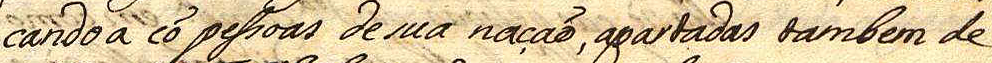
candoa cō pessoas de sua naçaõ, apartadas tambem de
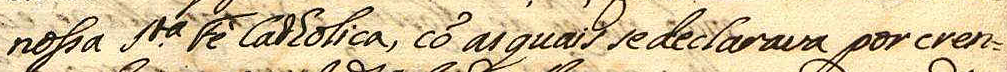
nossa S.ta Fé Catholica, cō as quais se declarava por cren
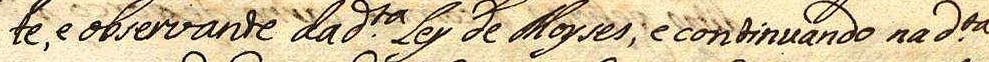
te, e observante da d.ta Ley de Moyses, e continuando na d.ta
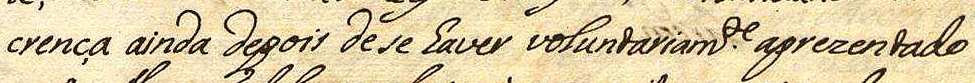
crença ainda depois de se haver voluntariam.te aprezentado
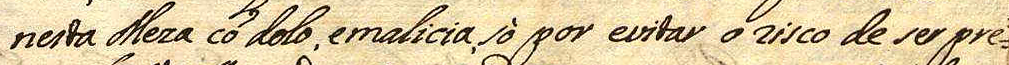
nesta Meza cō dolo, e malicia só por evitar o risco de ser pre
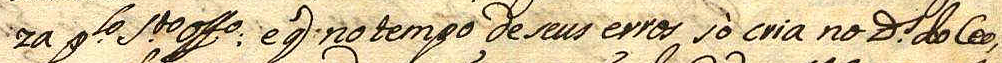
za p.lo S.to off.o; e q̄ no tempo de seus erros só cria no D.s do Ceo,
